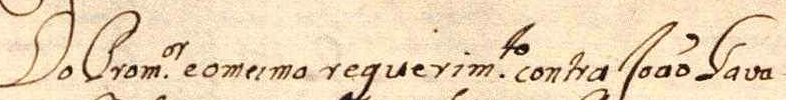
Do Prom.or e o mesmo requerim.to contra Joaõ Tava
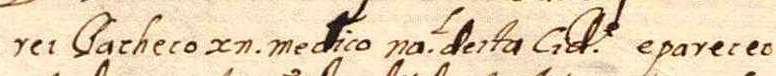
res Pacheco xn. medico na.l desta Cid̄.e e pareceo
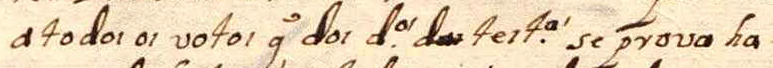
a todos os votos q̄ dos d.os das test.as se prova ha
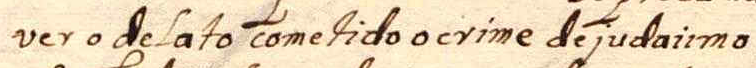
ver o delato cometido o crime de judaismo
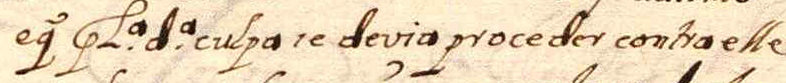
e q̄ pL.a d.a culpa se devia proceder contra elle
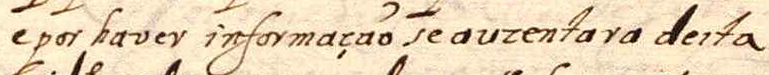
e por haver informaçaõ se auzentara desta
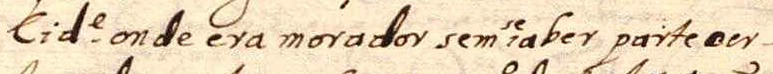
Cid.e onde era morador sem se saber parte cer
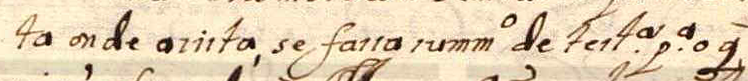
ta onde asista, se fassa summ.o de test.a p.a o q̄
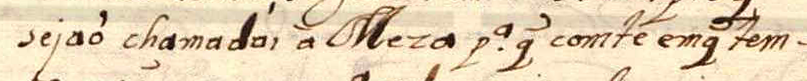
sejaõ chamados à Meza p.a q̄ comte em q̄ tem
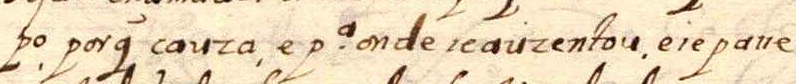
po, por q̄ cauza, e p.a onde se auzentou, e se passe
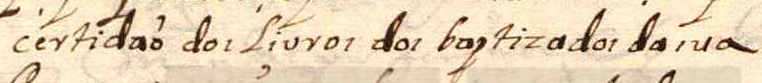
certidaõ dos Livros dos baptizados da sua
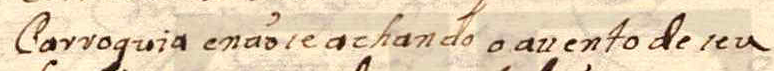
Parroquia e naõ se achando o assento de seu
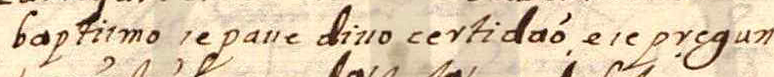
baptismo se passe disso certidaõ, e se pregun
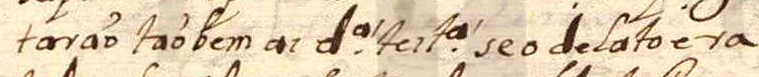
taraõ taõbem as d.as test.as se o delato era
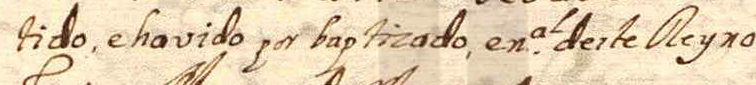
tido, e havido por baptizado, e n.al deste Reyno
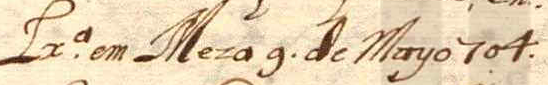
Lx.a em Meza 9. de Mayo 704.
